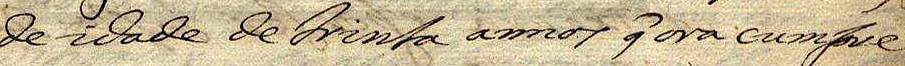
de idade de trinta annos q̄ ora cumpre
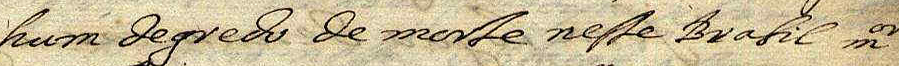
hum degredo de morte neste Brasil mor
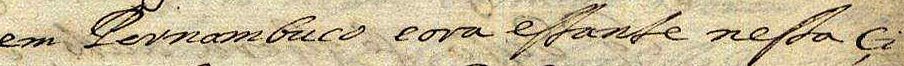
em Pernambuco e ora estante nessa çi
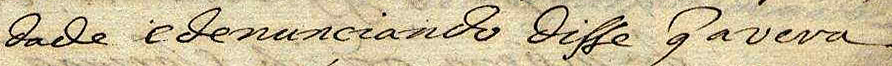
dade e denunciando disse q̄ avera
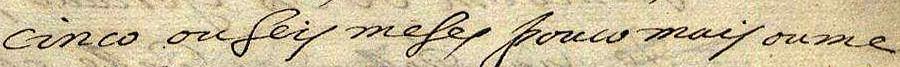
cinco ou seis meses pouco mais ou me
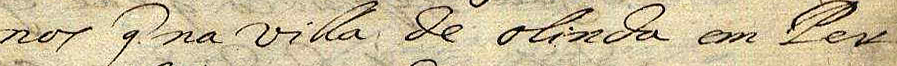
nos q̄ na villa de olinda em Per
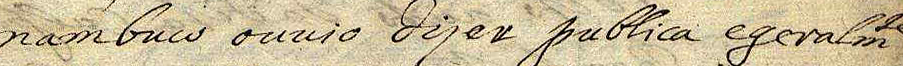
nambuco ouuio dizer publica e geralmte
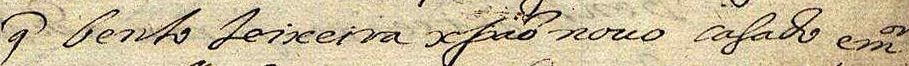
que bento teixeira xpaõ nouo casado e mor
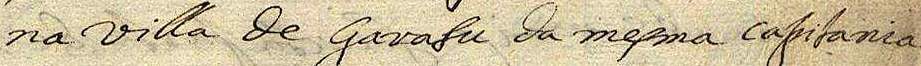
na villa de Garasu da mesma capitania
